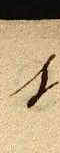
1
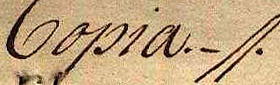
Copia.-//.
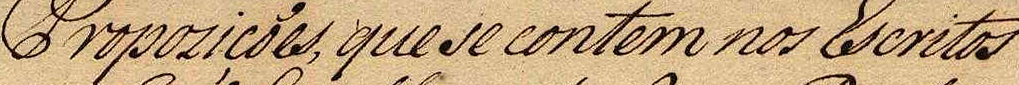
Propozições, que se contem nos Escritos
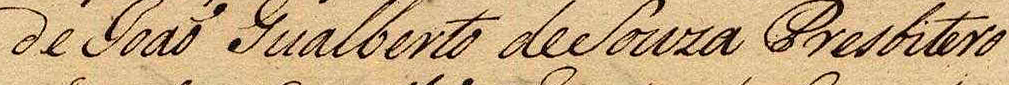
de Ioaõ Gualberto de Souza Presbitero
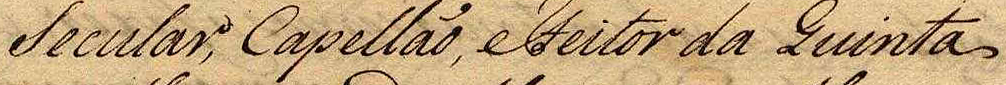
Secular, Capellaõ, e Feitor da Quinta
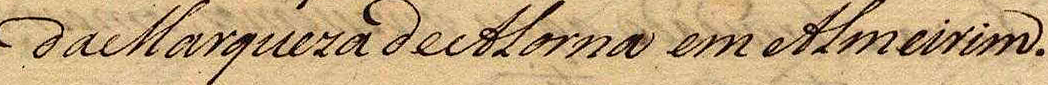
da Marqueza de ALorna em ALmeirim.
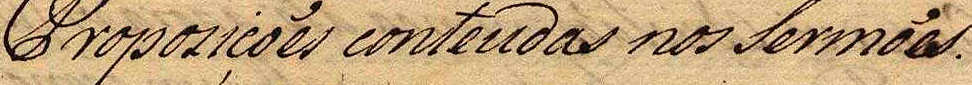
Propoziçoẽs conteudas nos Sermões.
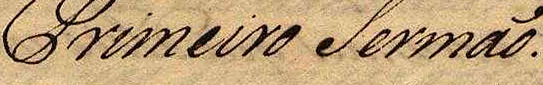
Primeiro Sermaõ.
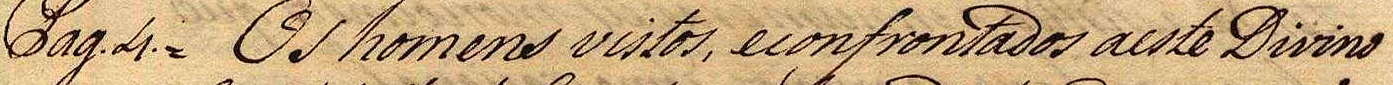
Pag.4.= Os homens vistos, e confrontados a este Divino
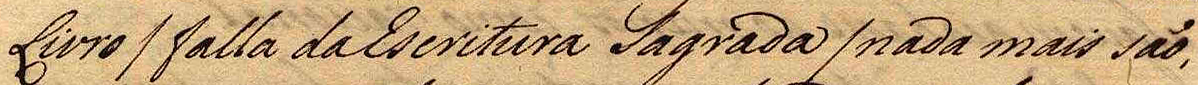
Livro / falla da Escritura Sagrada / nada mais saõ,
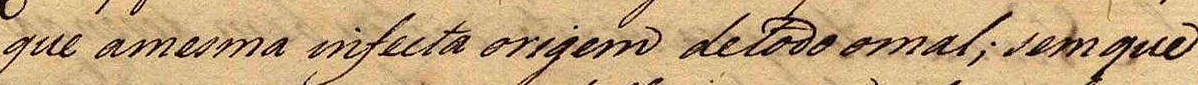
que a mesma infecta origem de todo o mal; sem que
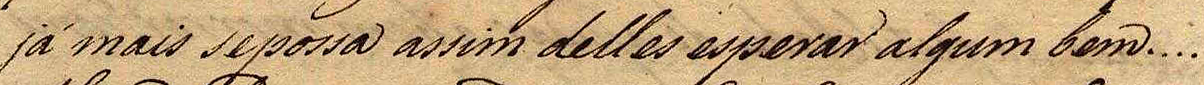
já mais se possa assim delles esperar algum bem....
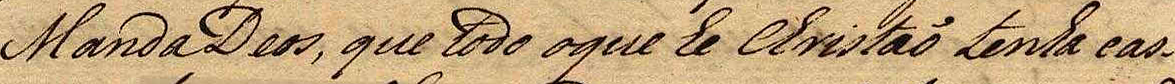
Manda Deos, que todo o que he Christaõ tenha cas
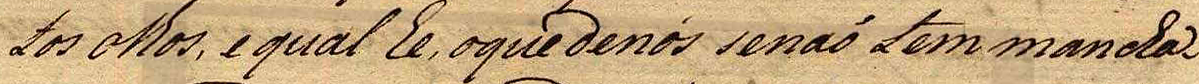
tos olhos, e qual he o que de nós senaõ tem mancha
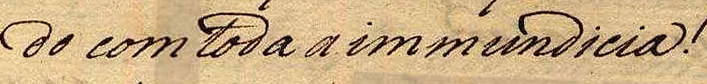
do com toda a immundicia!
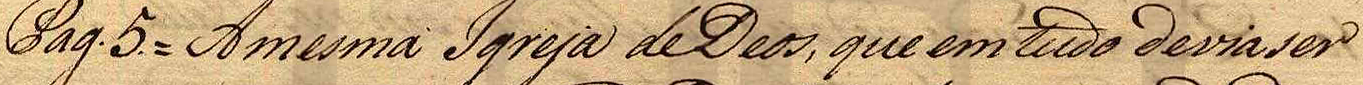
Pag. 5 = A mesma Igreja de Deos, que em tudo devia ser
